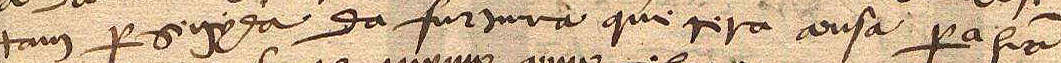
tam ꝑsegyda da furtuna que era cousa ꝑa huā
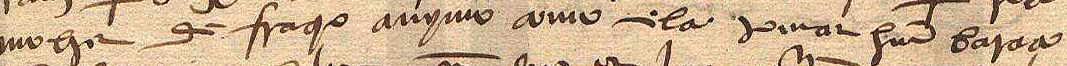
molher de fraqo anymo como ela tomar hū baraço
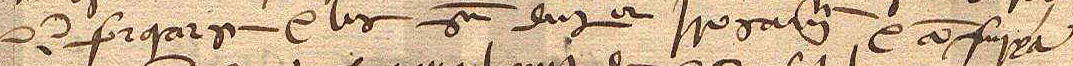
e ēforqarse e vos s̄or doutor Jrosamte e c̄o furya
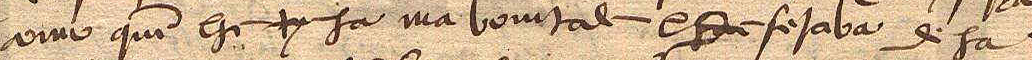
como quē lhe tynha ma vomtade e deseJava de ha
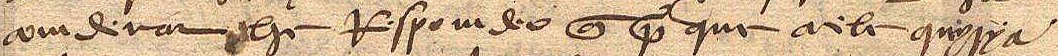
comdenar lhe Respomdeo q̄ p̄oque a ele quyrya
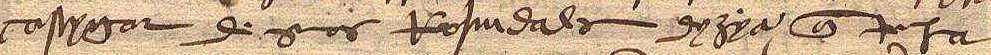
castygar de suas RoJmdades dyzya q̄ tnha
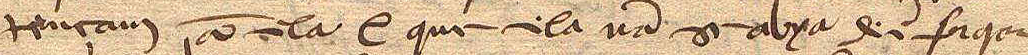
tençam c̄o ela e que ela nā se avya de ēforqar
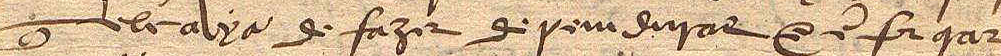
q̄ ele avya de fazer depemdurar ē ēforqar
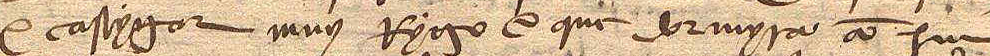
e castygar muy Rygo e que dormyra c̄o hū
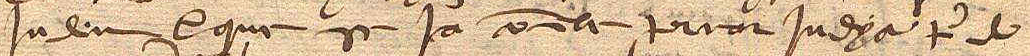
Judeu e que se Ja c̄o ele tornar Judya tēdo
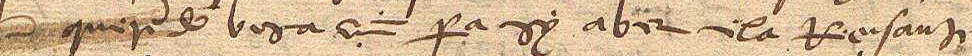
e querēdo vosa m̄ ꝑa sy aver ela Recusante
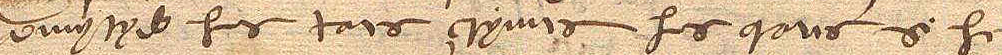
comytydo hos taes crymes hos qaees se he
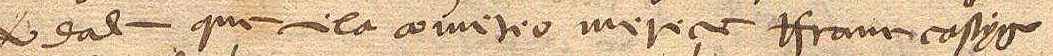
ꝟdade que ela cometeo merece graue castygo
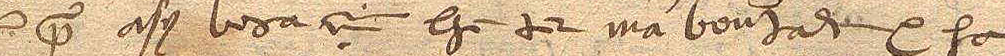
e p̄o asy vosa m̄ lhe ter ma vontade e ha
